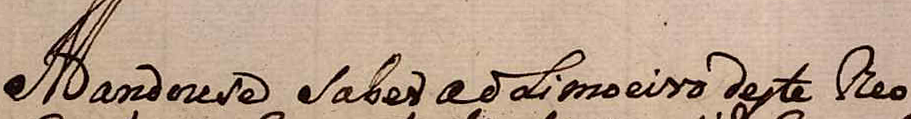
Mandouse saber ao Limoeiro deste Reo
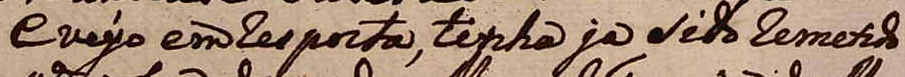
e veyo em respozta, tinha ja sido remetido
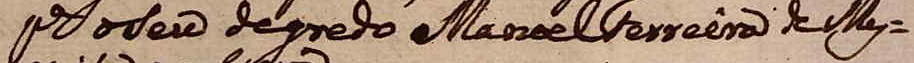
p.a o seu degredo Manoel Ferreira de Mes
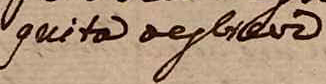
quita o esCrevi
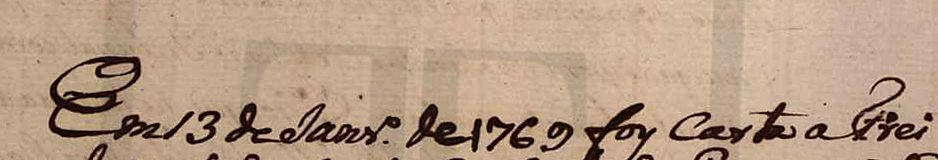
Em 13 de Ianr.o de 1769 foy carta a Frei
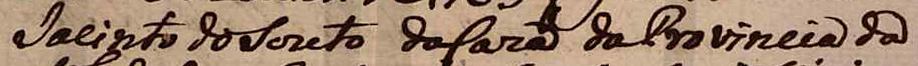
Iacinto do Souto da Caza da Provincia da
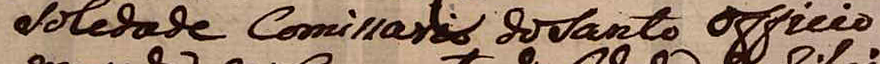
soledade comissario do Santo officio
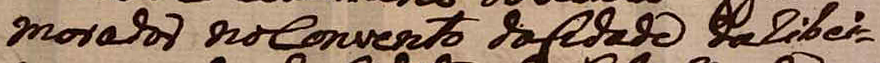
morador no convento da Cidade da ribei
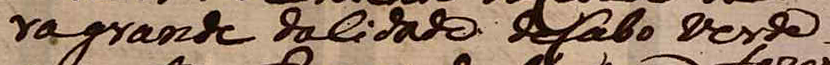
ra grande da cidade de Cabo verde
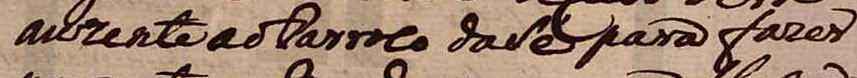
auzente ao Parroco da Sé para fazer
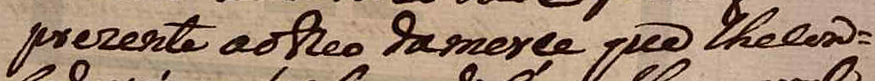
prezente ao Reo da merce que lhe con
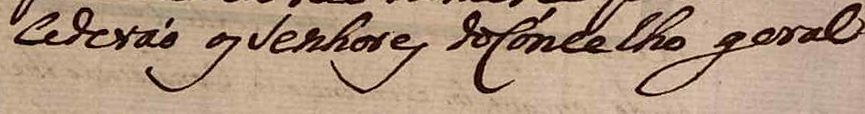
cederaõ os senhores do Concelho geral
